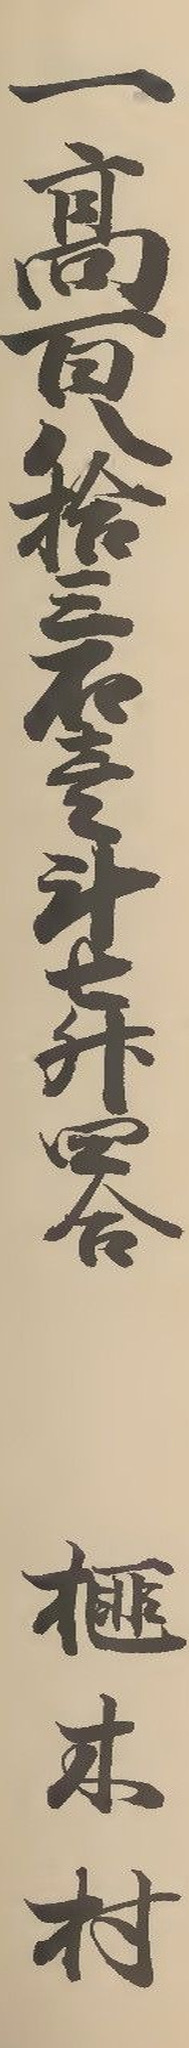一髙百八拾三石壱斗七升四合木村
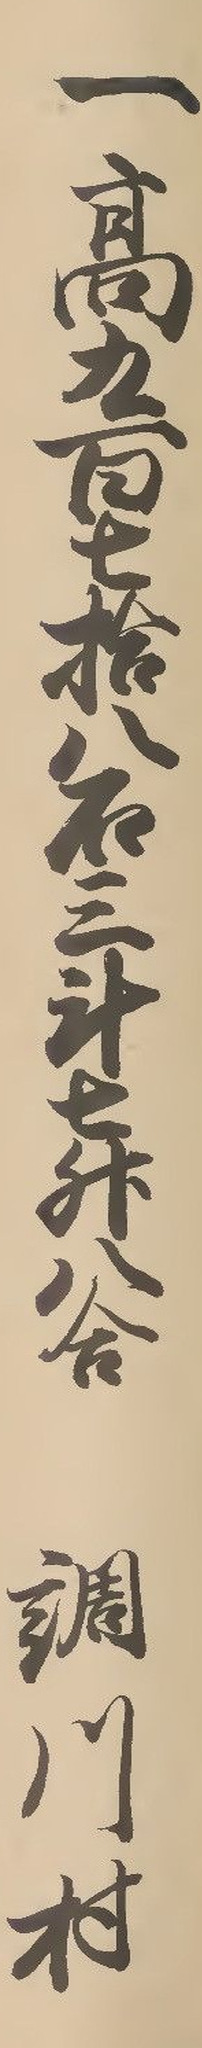一髙九百七拾八石三斗七升八合調川村
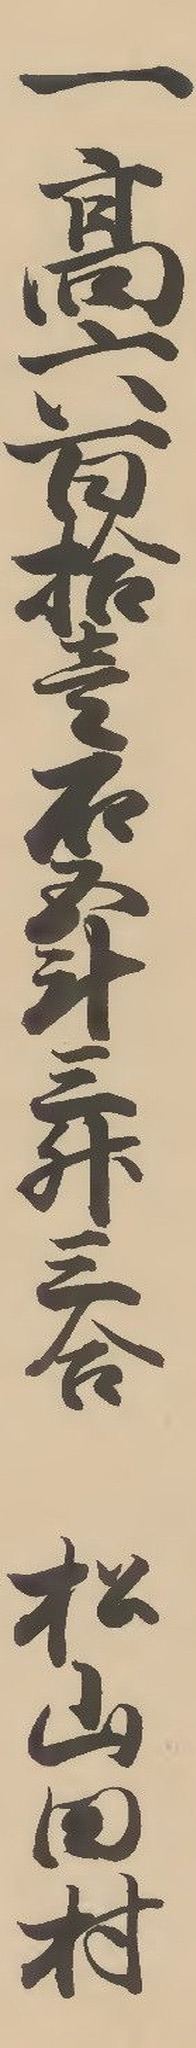一髙六百拾壱石五斗三升三合松山田村
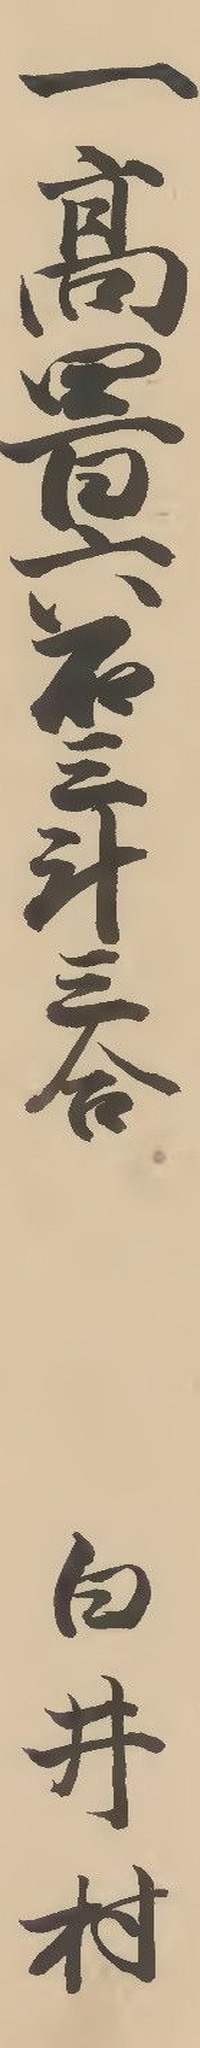一髙四百六石三斗三合白井村
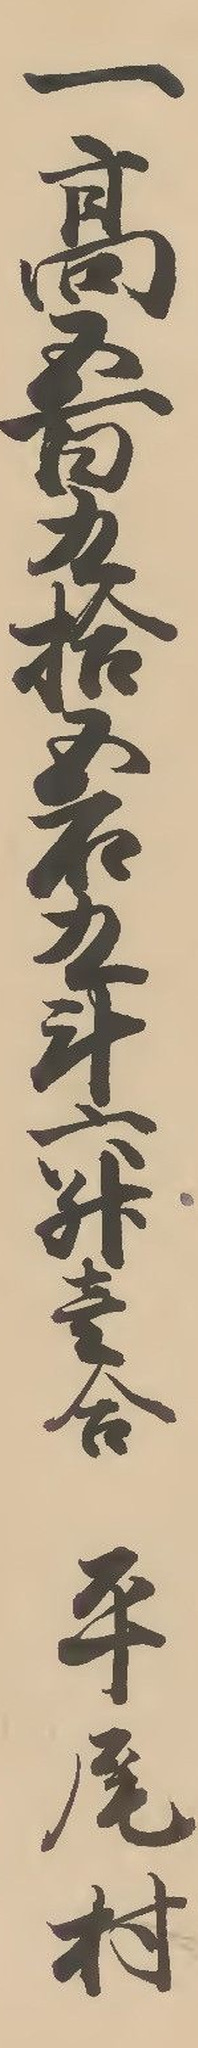一髙五百九拾五石九斗六升壱合平尾村

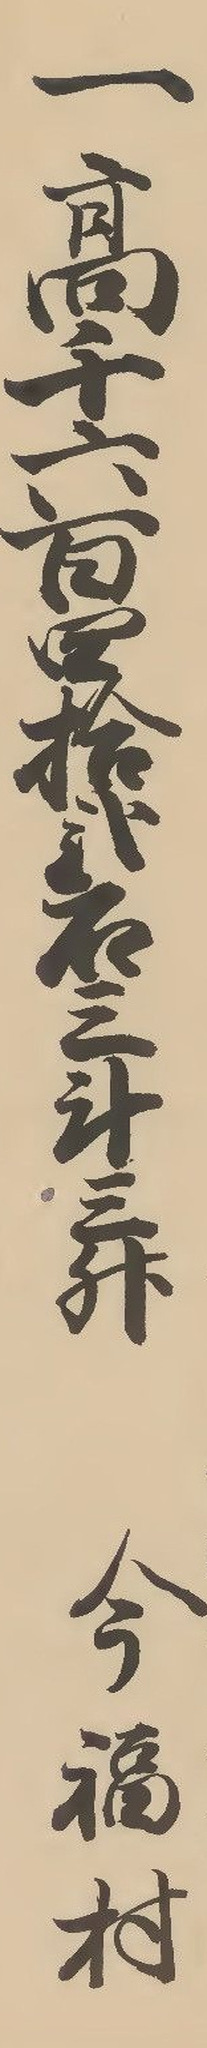一髙千六百四拾弐石三斗三升今福村
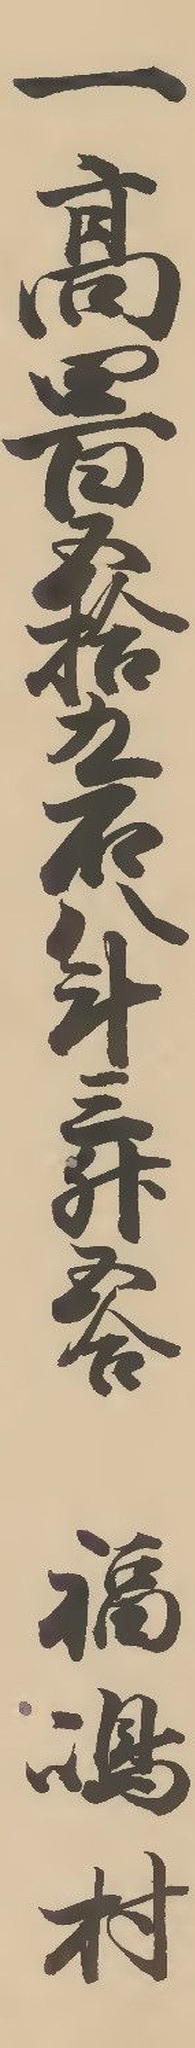一髙四百五拾九石八斗三升五合福嶋村
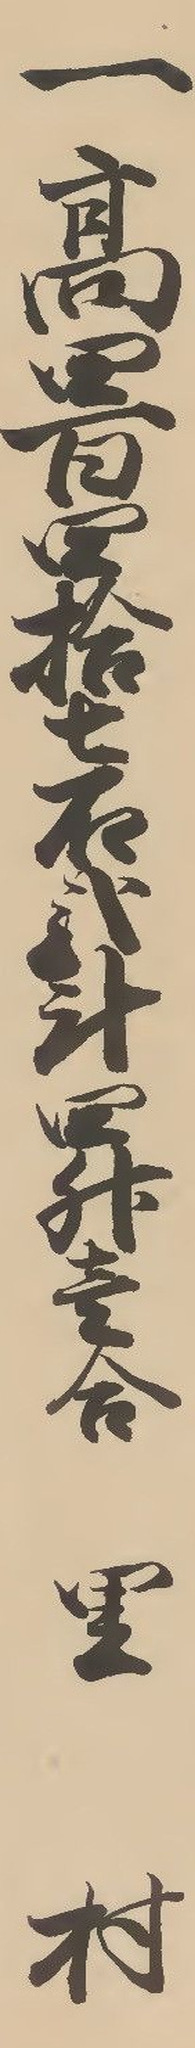一髙四百四拾七石弐斗四升壱合里村
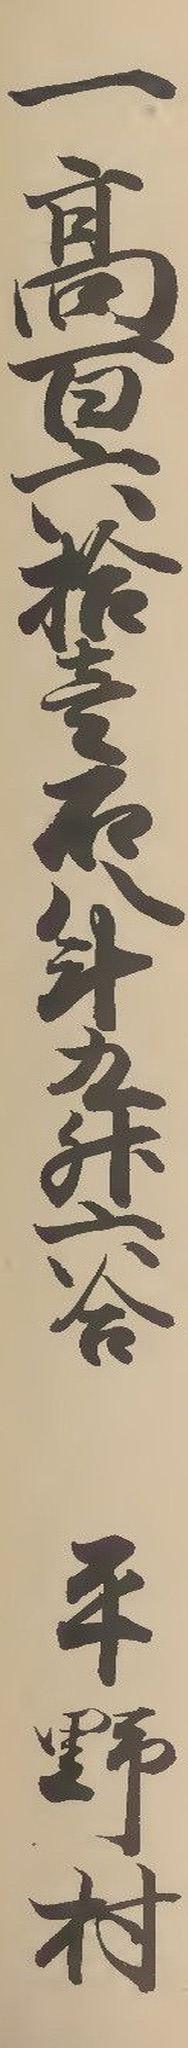一髙百六拾壱石八斗九升六合平野村
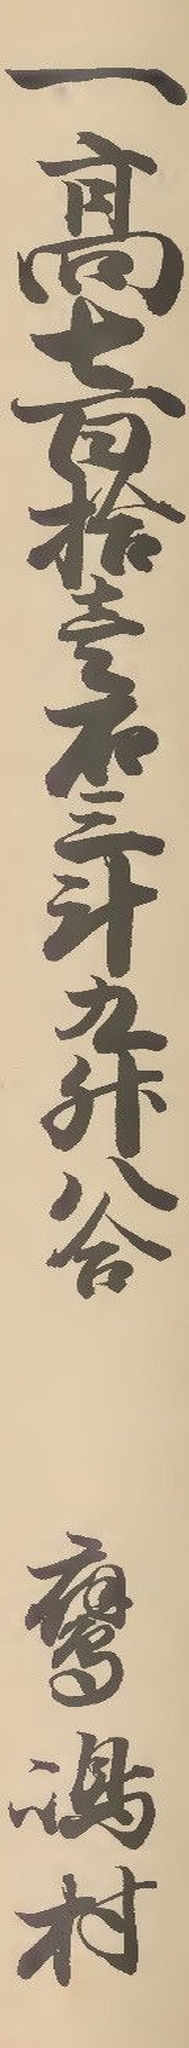一髙七百拾壱石三斗九升八合鷹嶋村
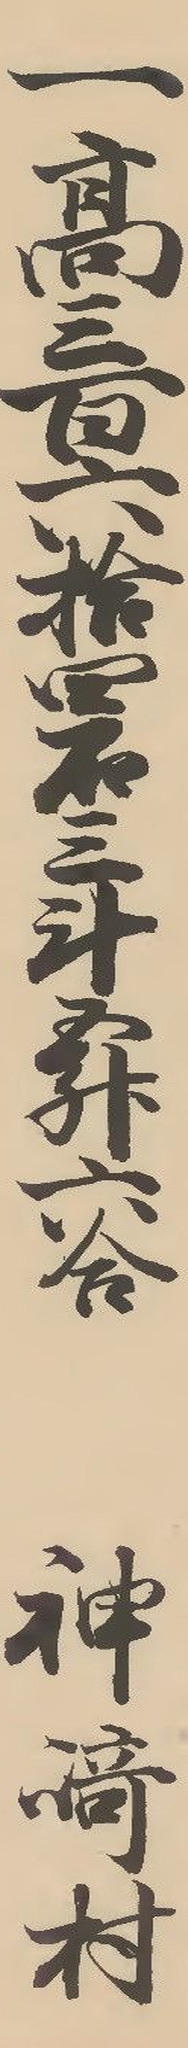一髙三百六拾四石三斗五升六合神崎村
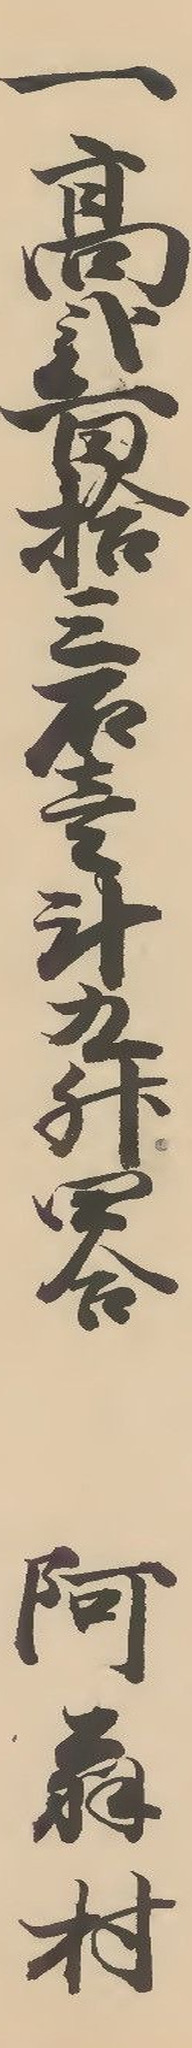一髙弐百拾三石壱斗九升四合阿翁村
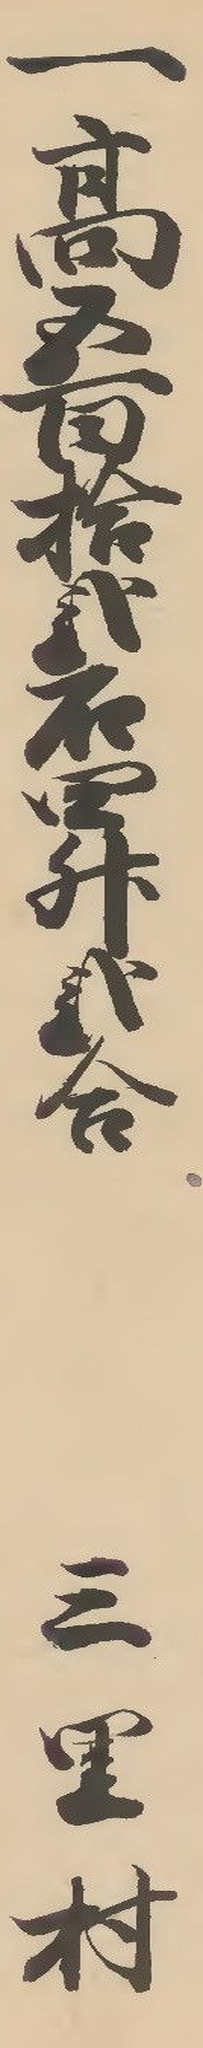一髙五百拾弐石四升弐合三里村

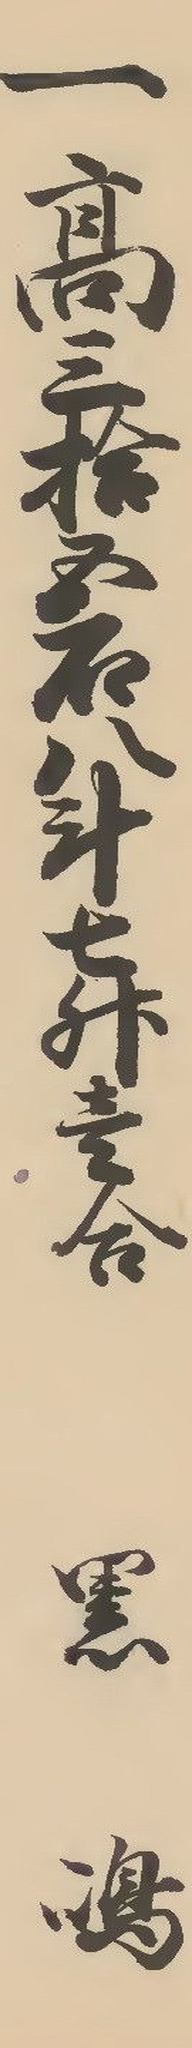一髙三拾五石八斗七升壱合黑嶋
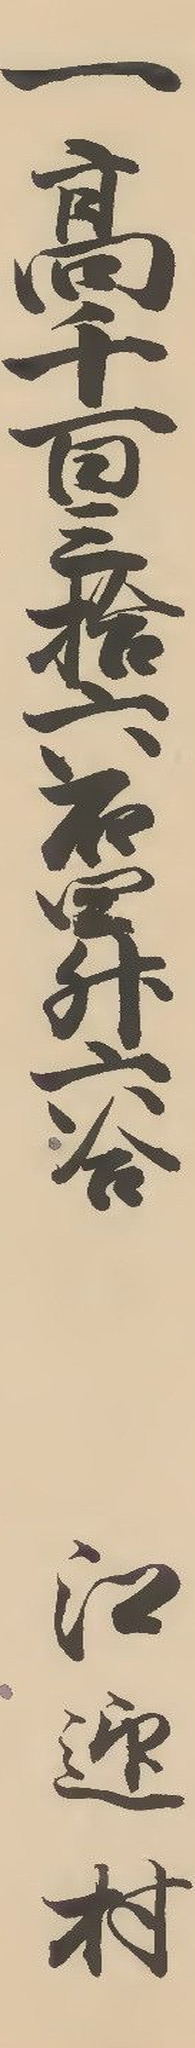一髙千百三拾六石四升六合江迎村
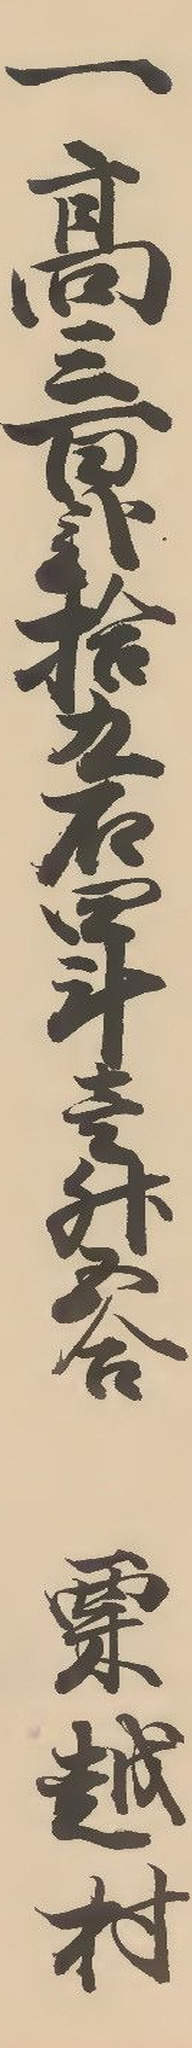一髙三百弐拾九石四斗壱升五合栗越村
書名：肥前国郷帳
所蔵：国立公文書館 National Archives of Japan
